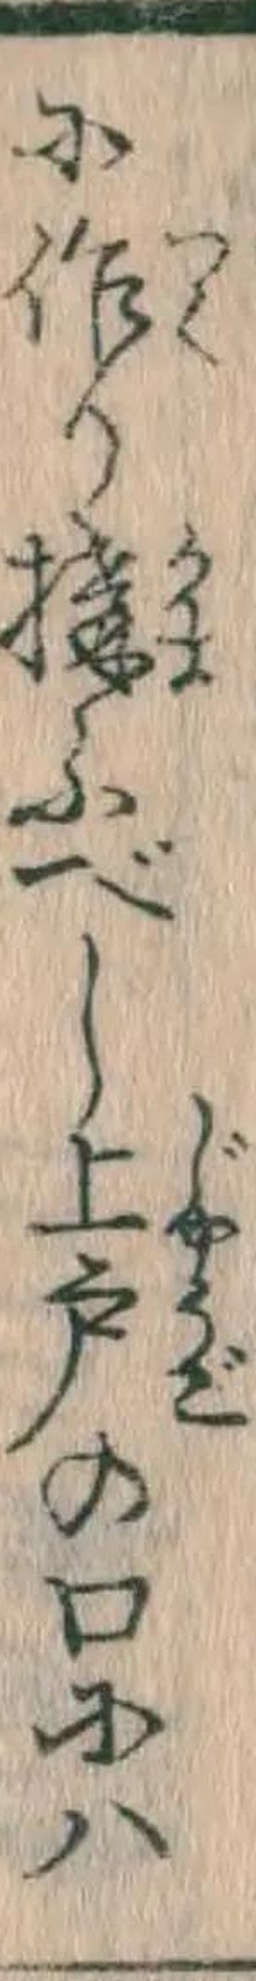に作り構ふべし上戸の口には
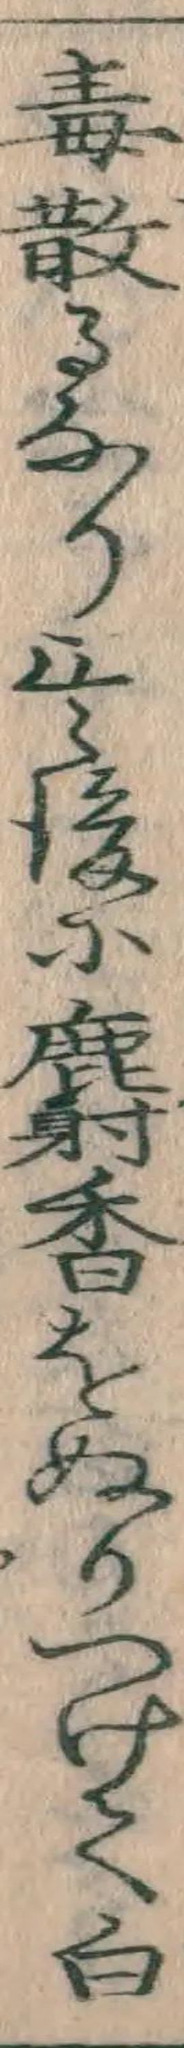毒散るなり其後に麝香をぬりつけて白
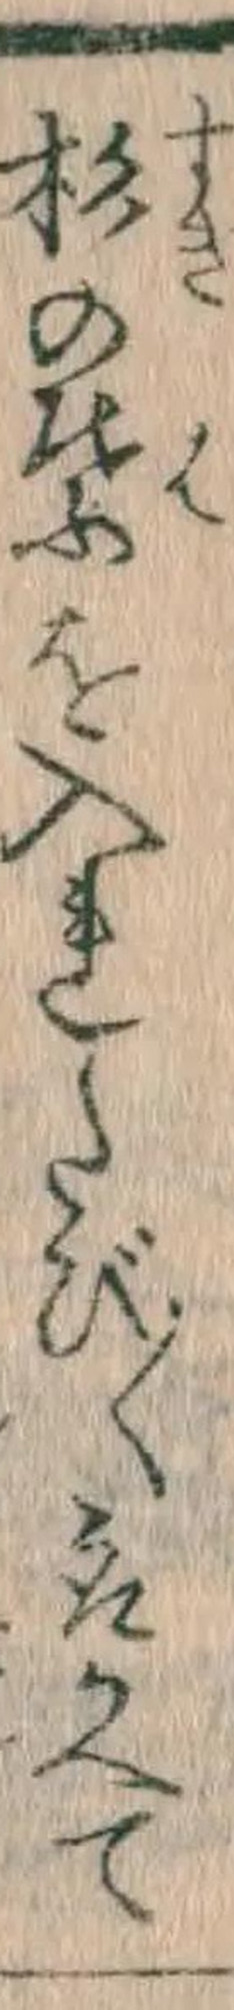杉の葉を入れたび〳〵取かへて
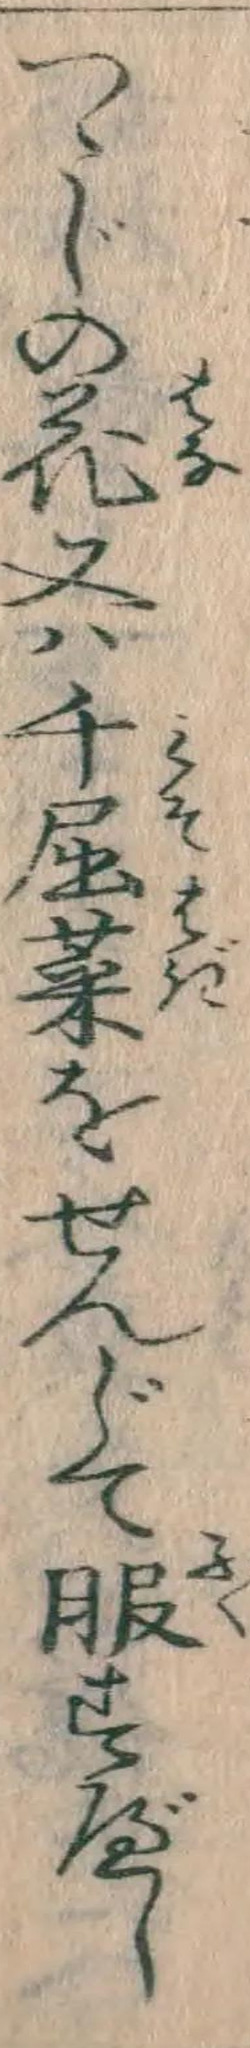つゝじの花又は千屈菜をせんじて服すべし
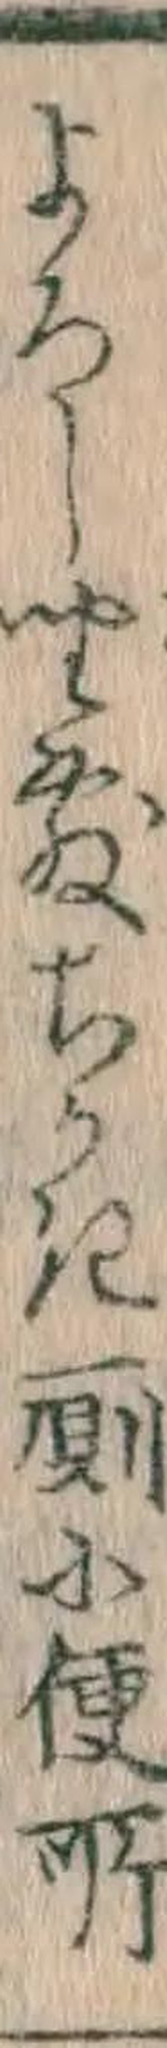よろし坐敷ちかき厠小便所
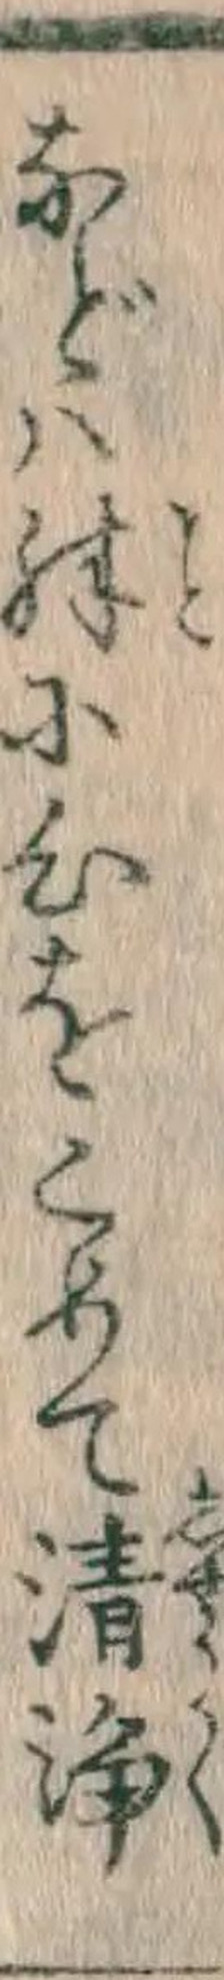などは殊に心をこめて清浄
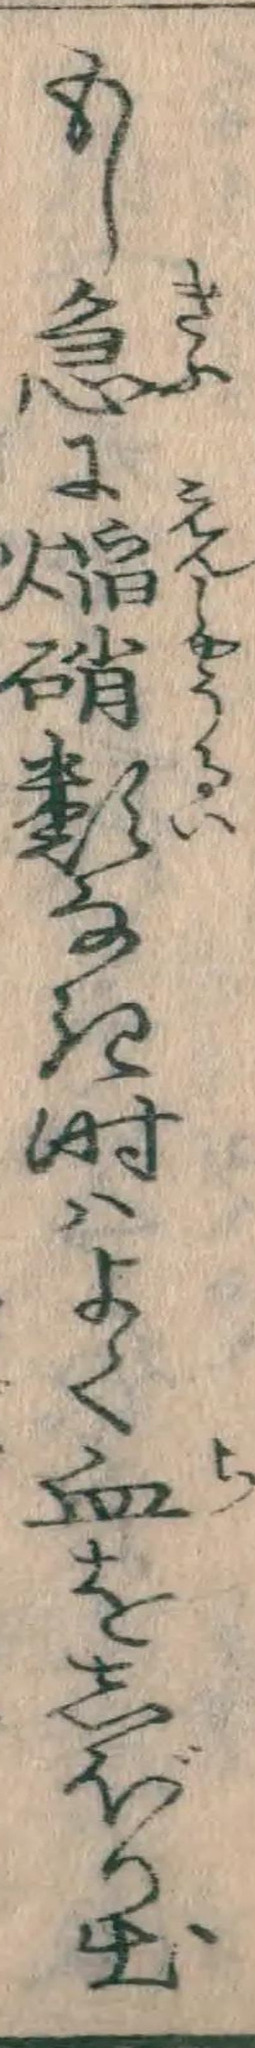もし急に焔硝類なき時はよく血をしぼり出
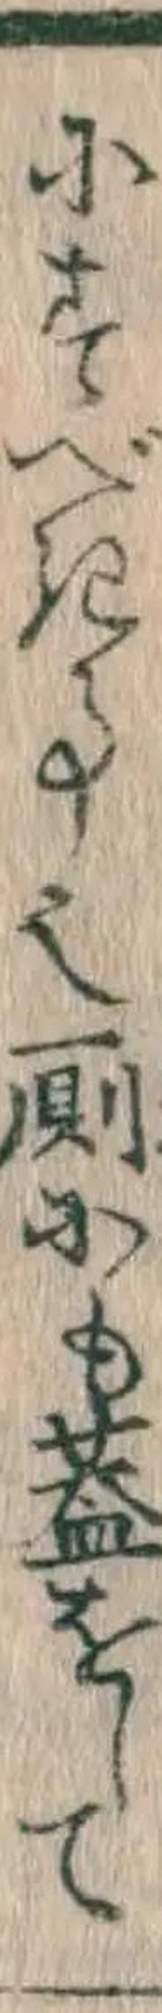にすべき事也厠にも蓋をして
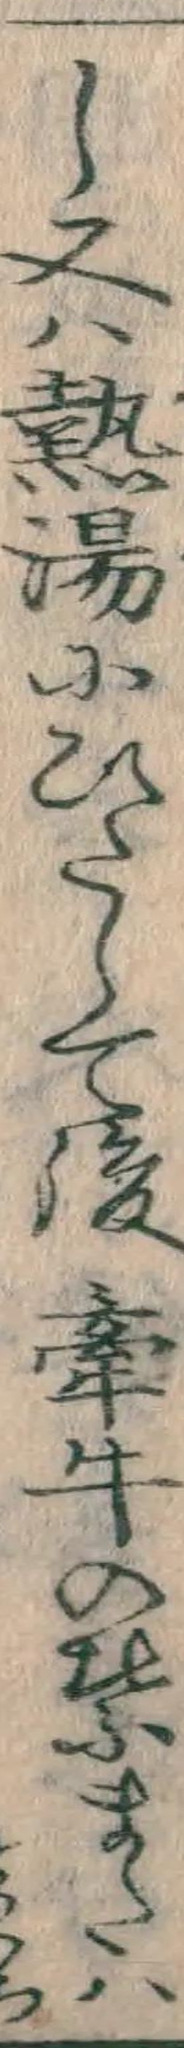し又は熱湯にひたして後牽牛の葉または
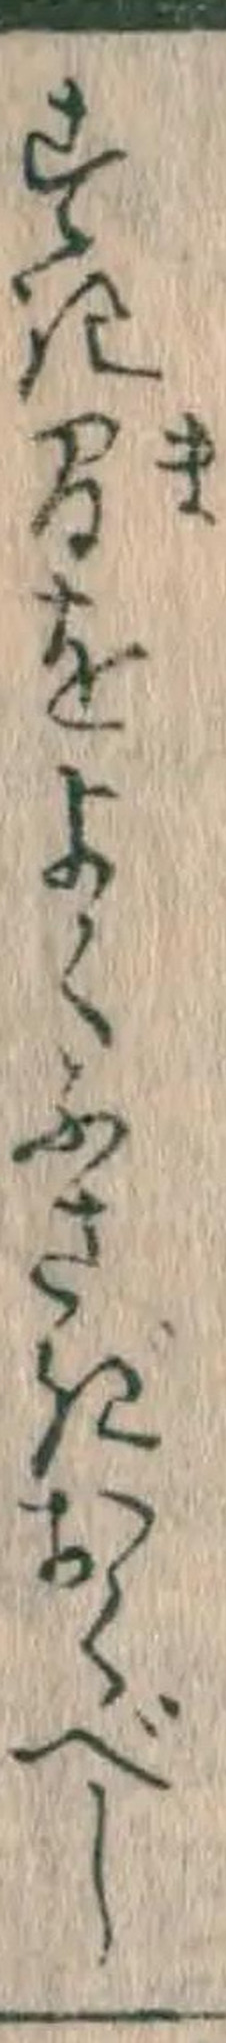すき間をよくふさきおくべし
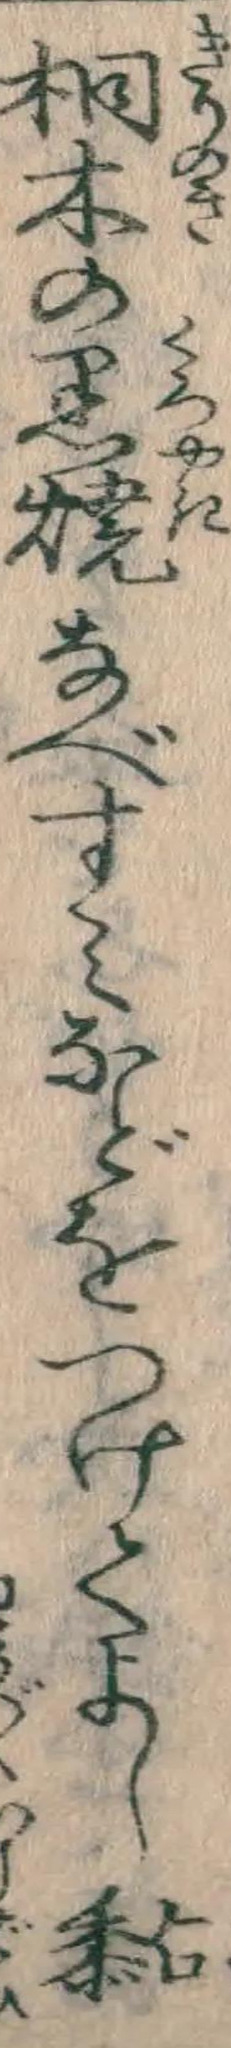桐木の黒焼なべすみなどなどをつけてよし黏
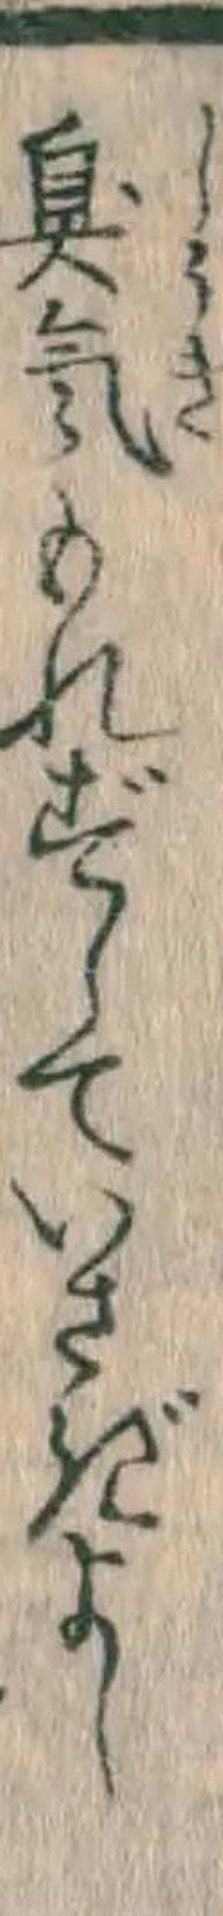臭気もれずしていさぎよし
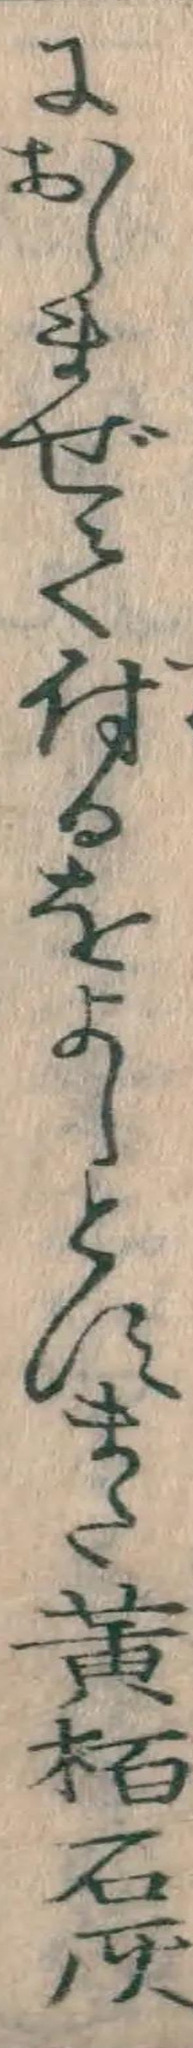におしまぜて付るをよしとすまた黄栢石灰
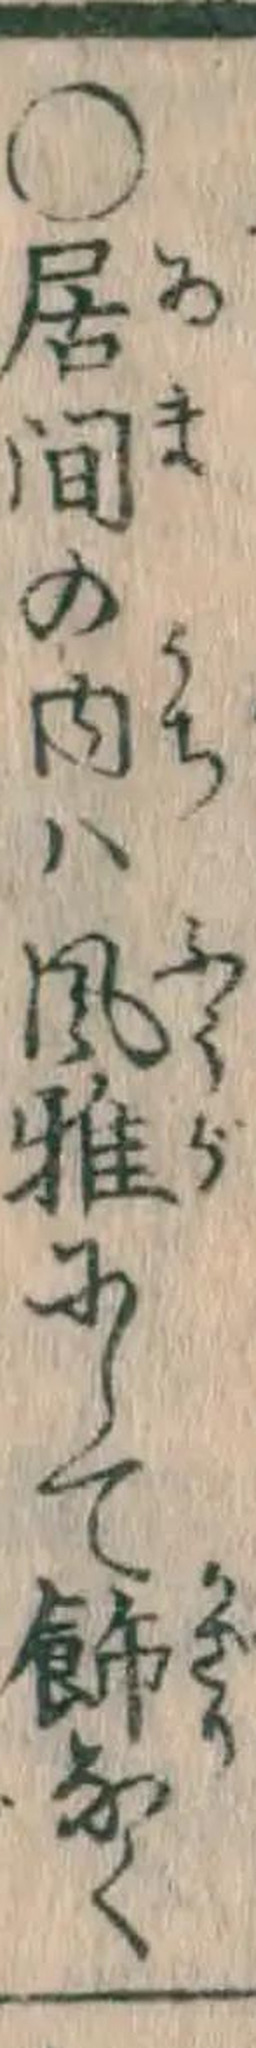○居間の内は風雅にして飾なく
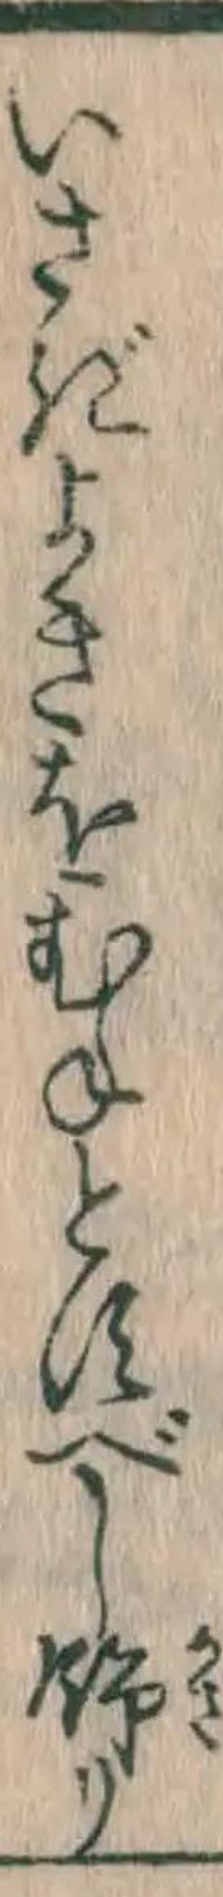いさぎよきをむねとすべし飾り
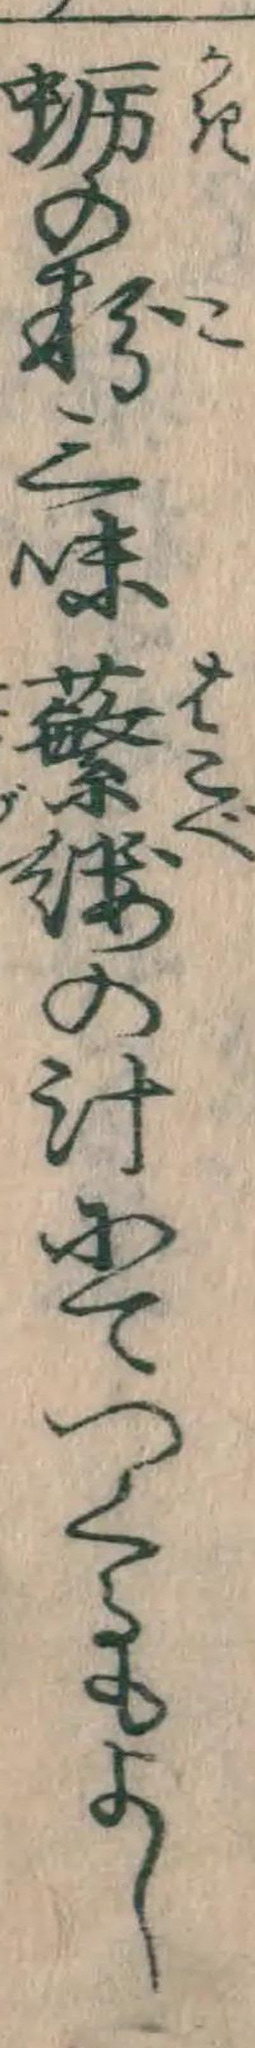蛎の粉三味蘩縷の汁にてつくるもよし
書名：広益秘事大全 3巻. [3]
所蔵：国立国会図書館 National Diet Library, JAPAN
